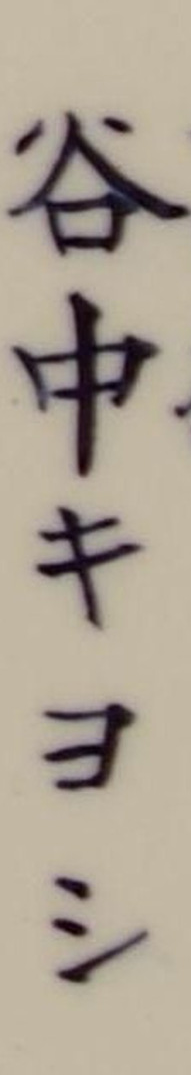谷中キヨシ
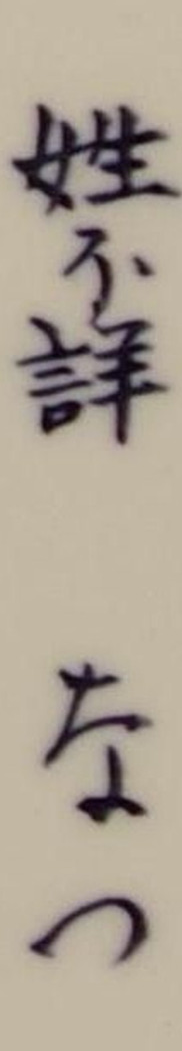姓不詳なつ
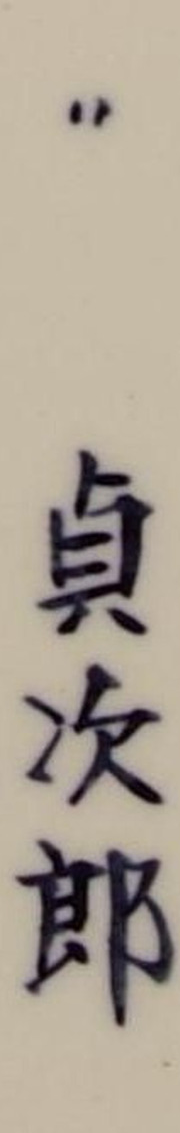貞次郎
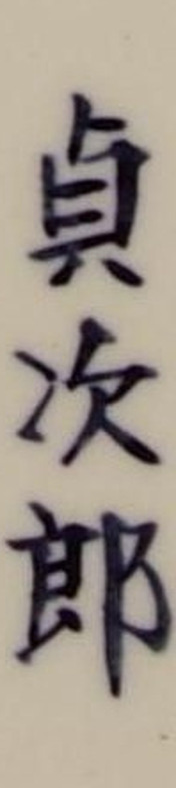貞次郎
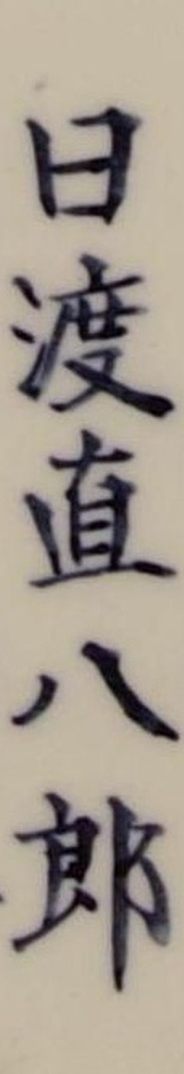日渡直八郎
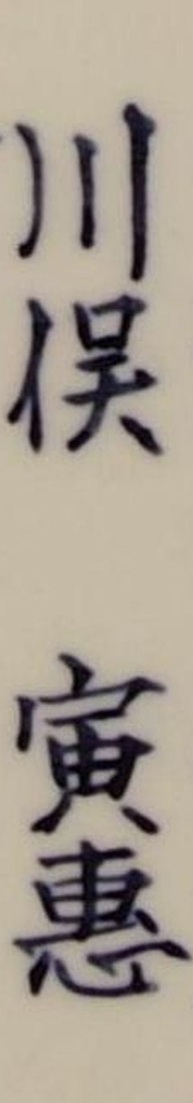川俣寅恵
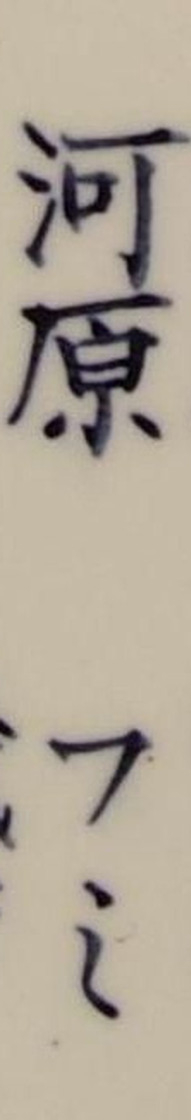河原フミ
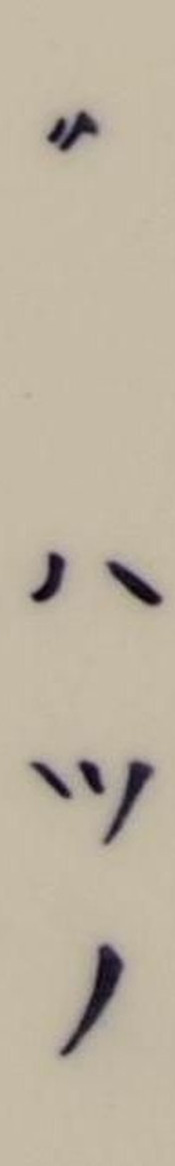ハツノ
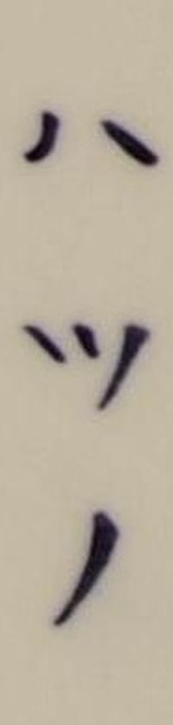ハツノ
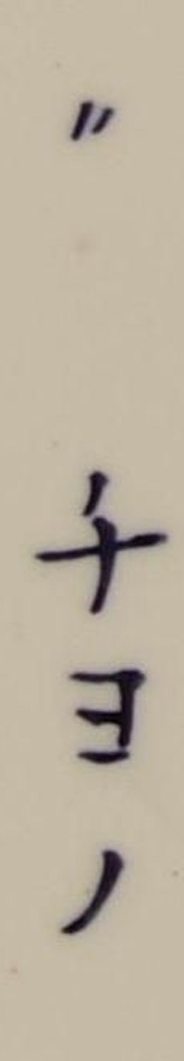チヨノ
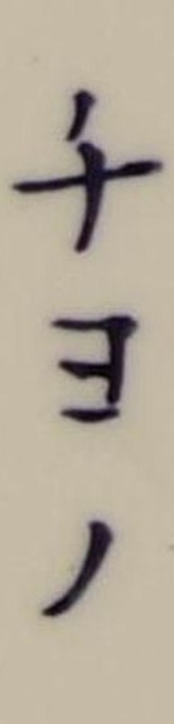チヨノ
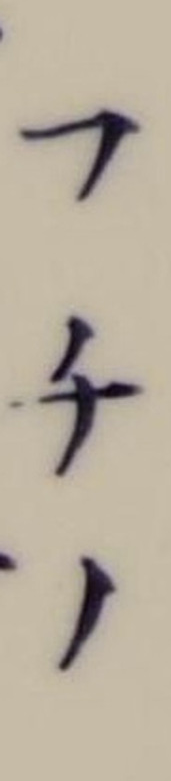フチノ
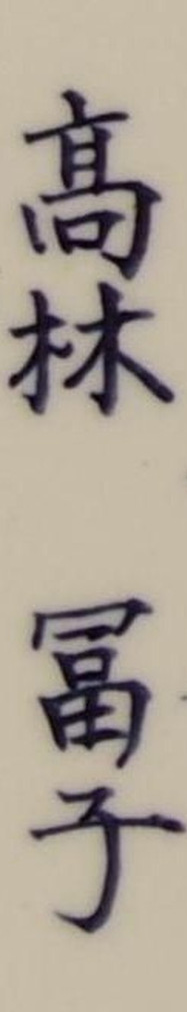高林冨子
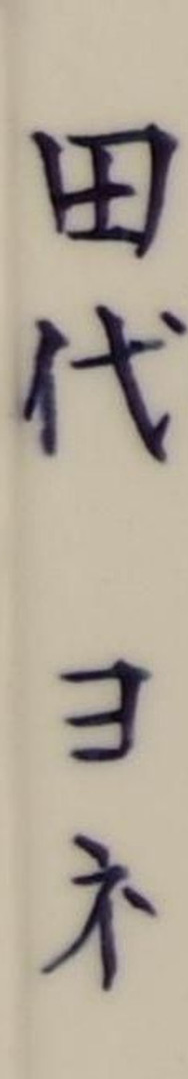田代ヨネ

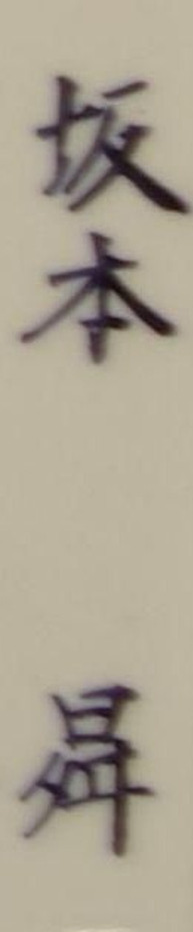坂本昇
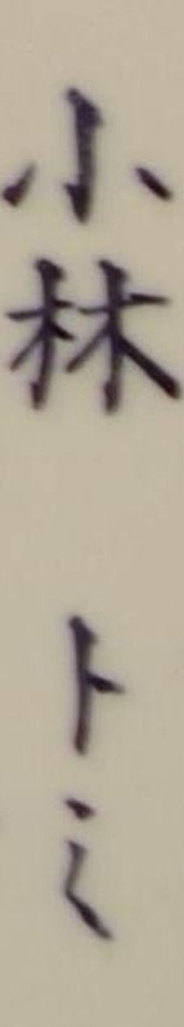小林トミ
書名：M~S
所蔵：高野山金剛峯寺
